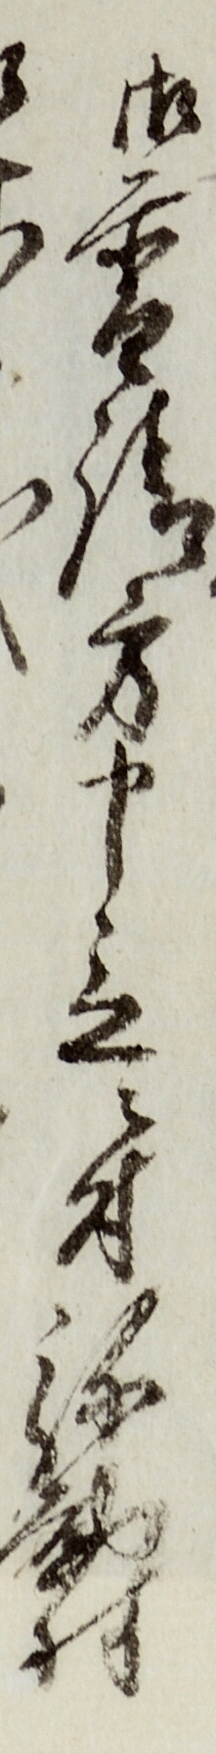御普請方申立ニ付弥勒村
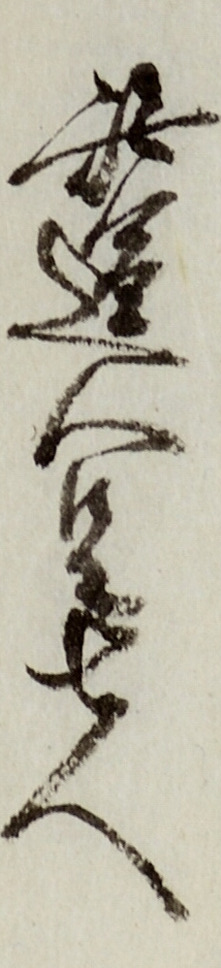此運人足七人
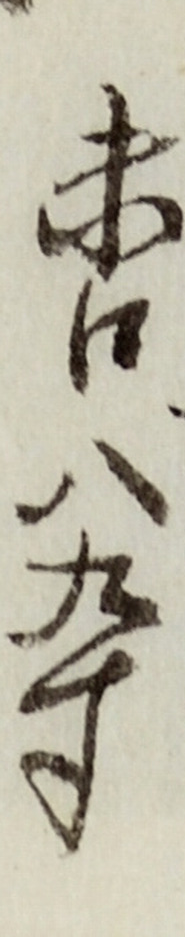末口八九寸
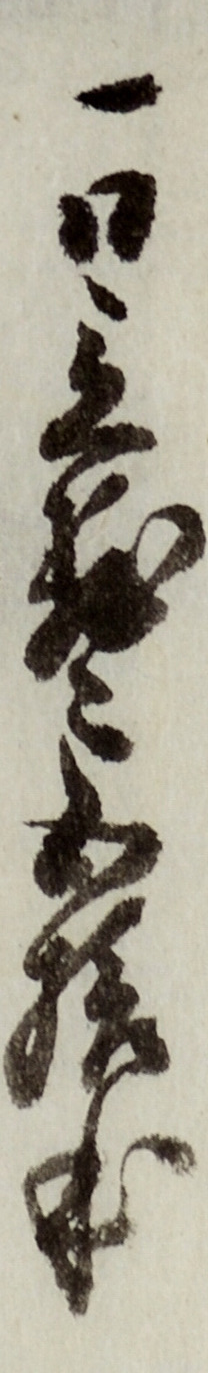一同立物ニ五拾本
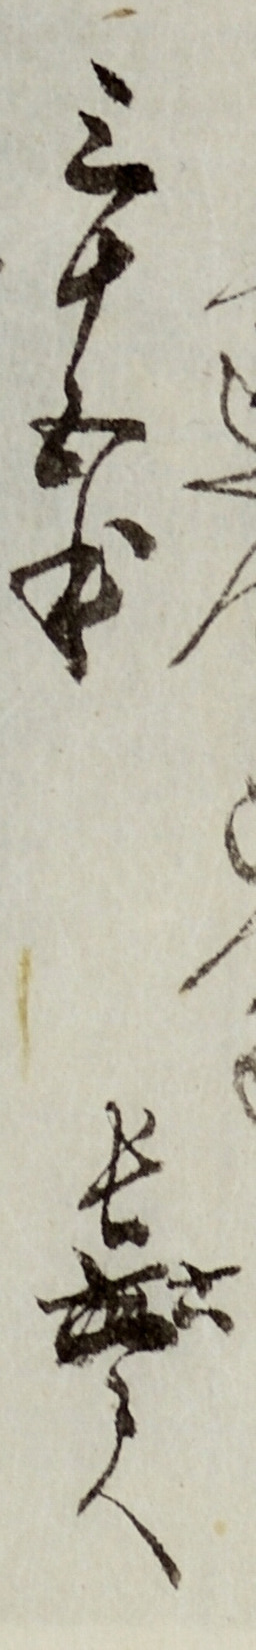三十五本長六尺
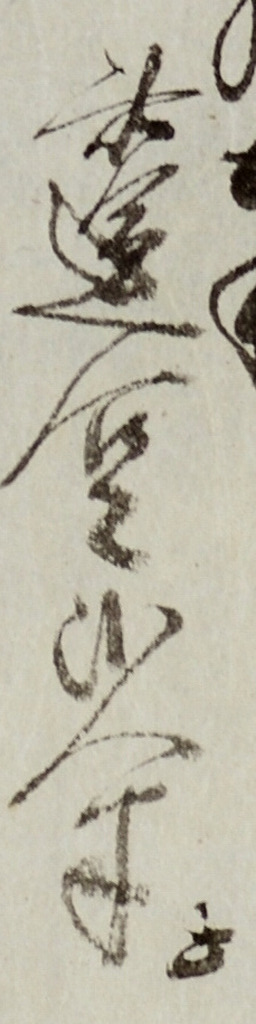此運人足弐人半与

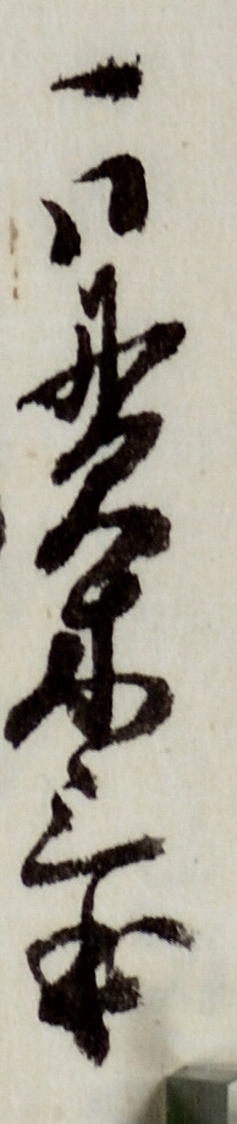一同貫木三本
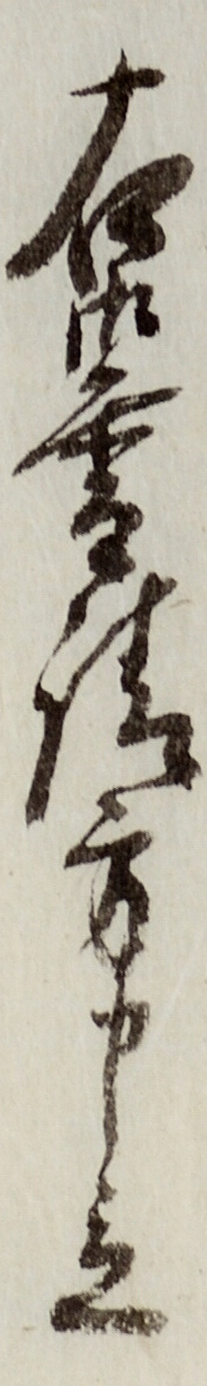右御普請方申立
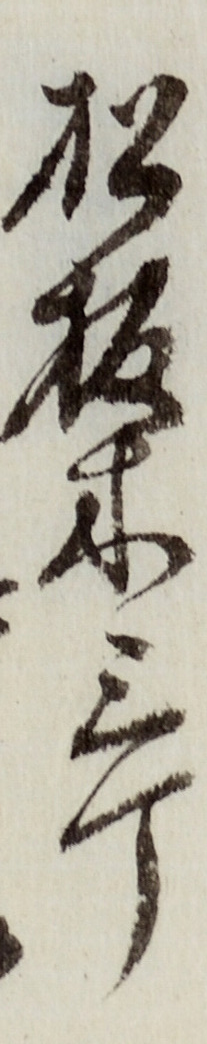松板木三丁
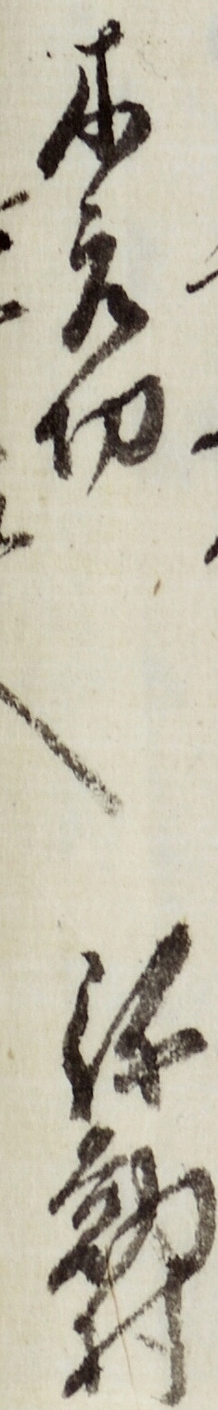木元切弥勒村
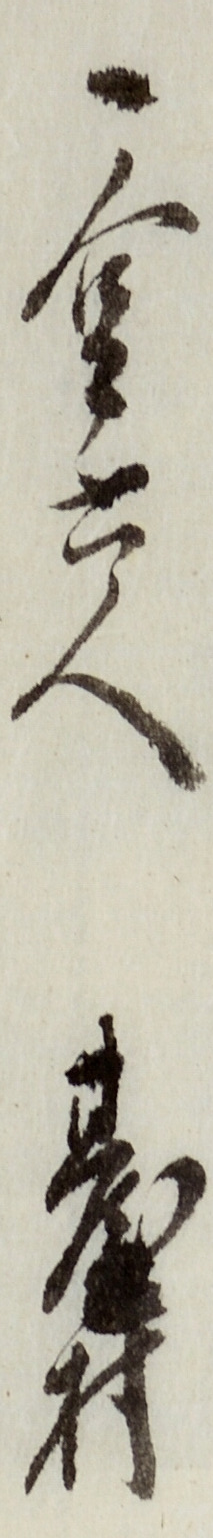一人足六人台村
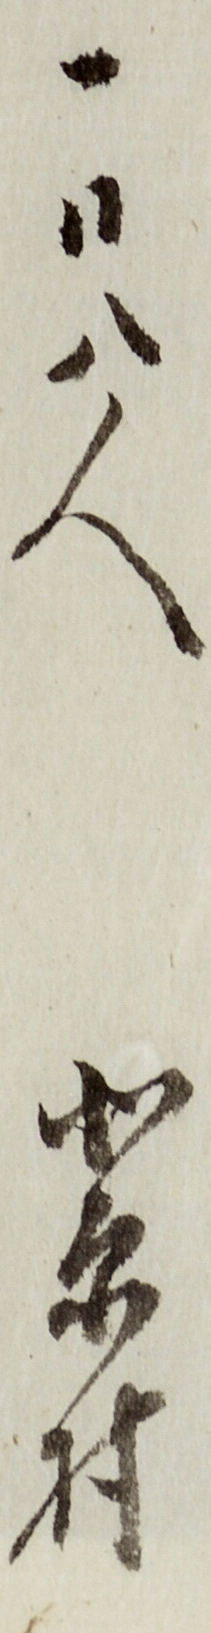一同八人北原村
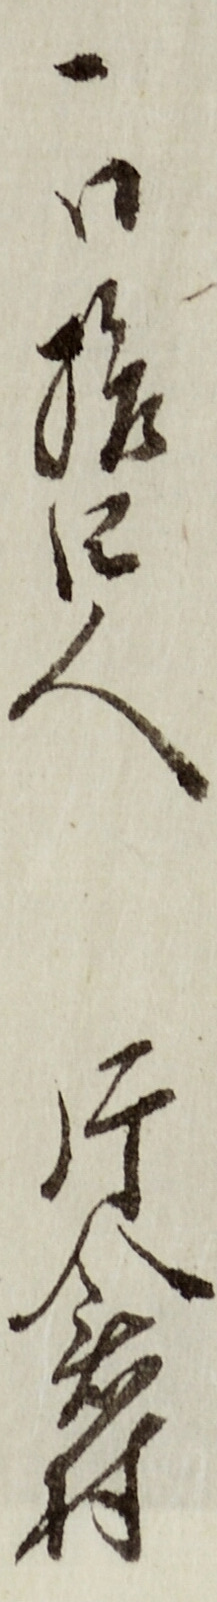一同拾四人片倉村
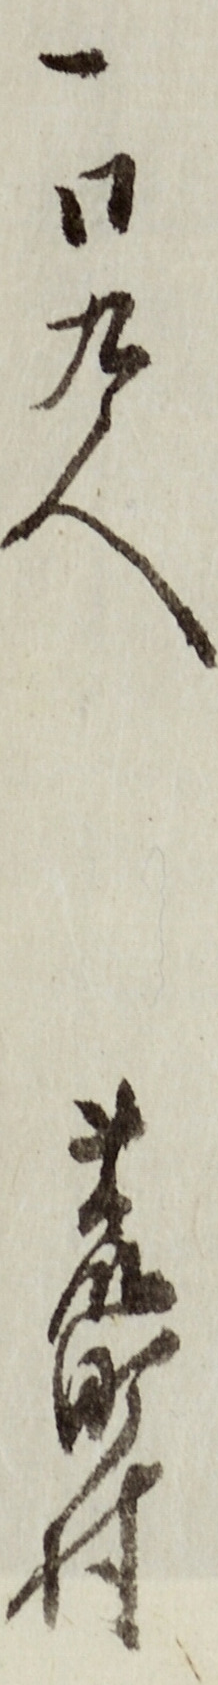一同九人荒町村
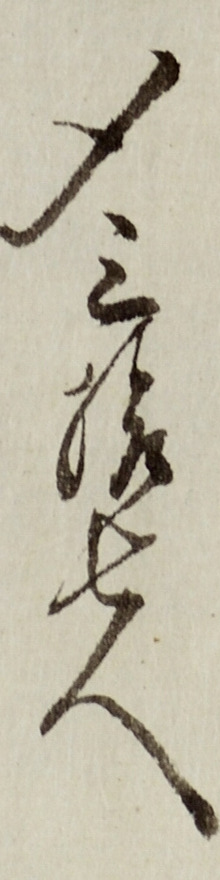〆三拾七人
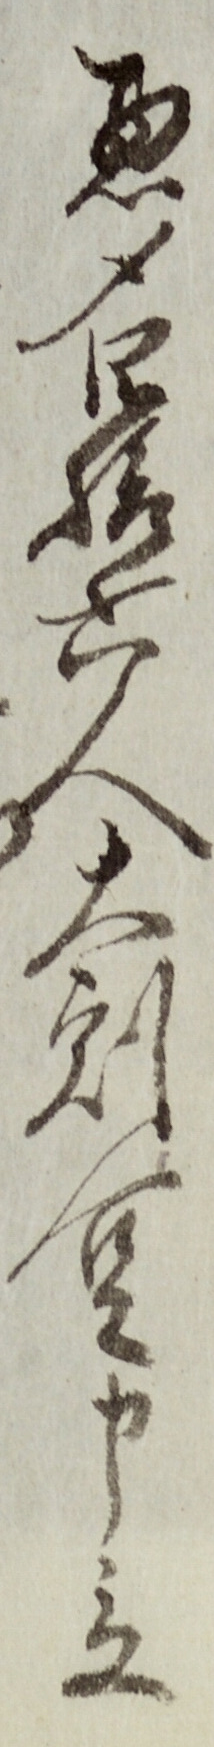惣〆四拾六人大割人足申立
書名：中沢郷御竹薮見廻り
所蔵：伊那市立高遠町図書館・合同会社AMANE
